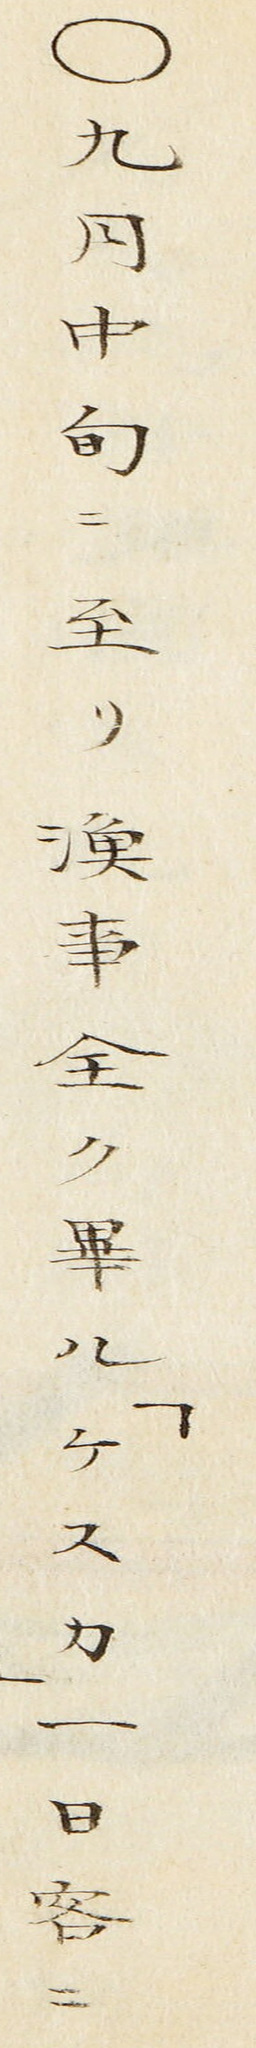○九月中旬ニ至リ漁事全ク畢ル「ケスカ」一日客ニ
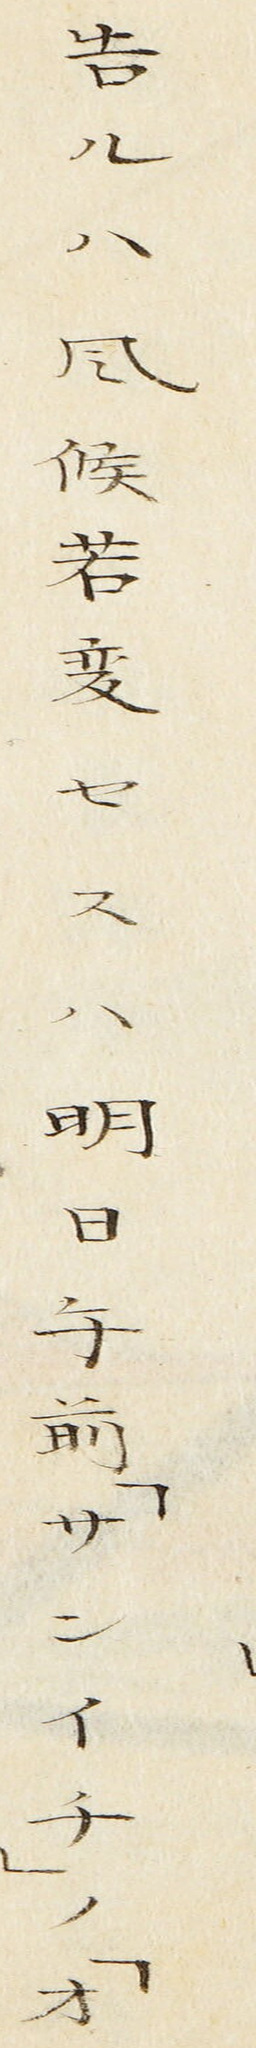告ルハ風候若変セスハ明日午前「サンイチ」ノ「オ
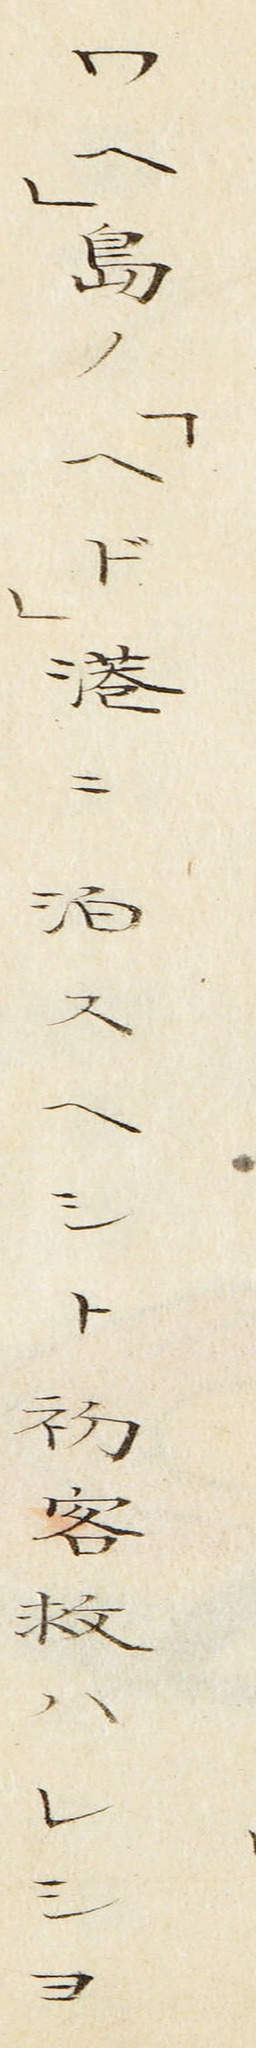ワヘ」島ノ「ヘド」港ニ泊スヘシト初客救ハレシヨ
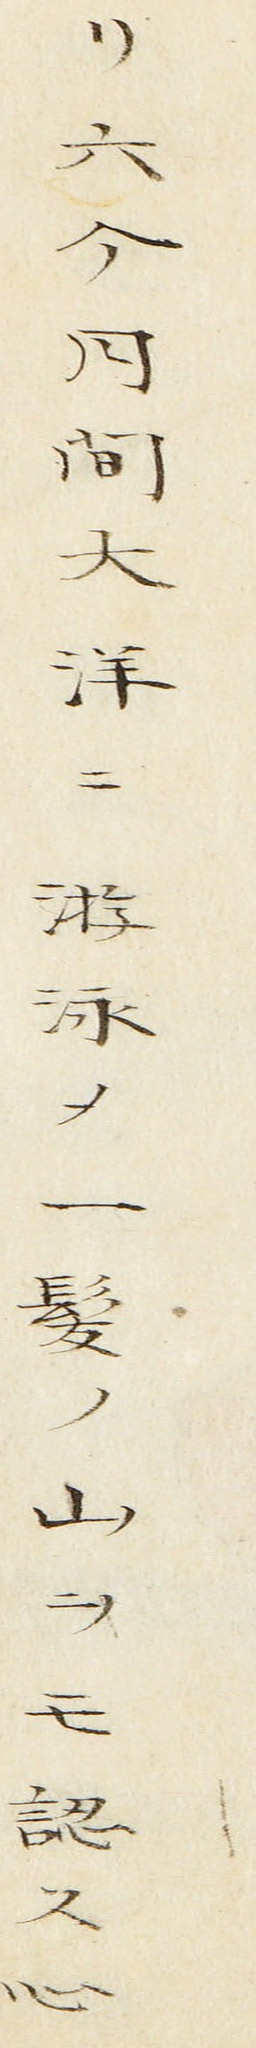リ六ケ月間大洋ニ游泳シテ一髪ノ山ヲモ認ス心
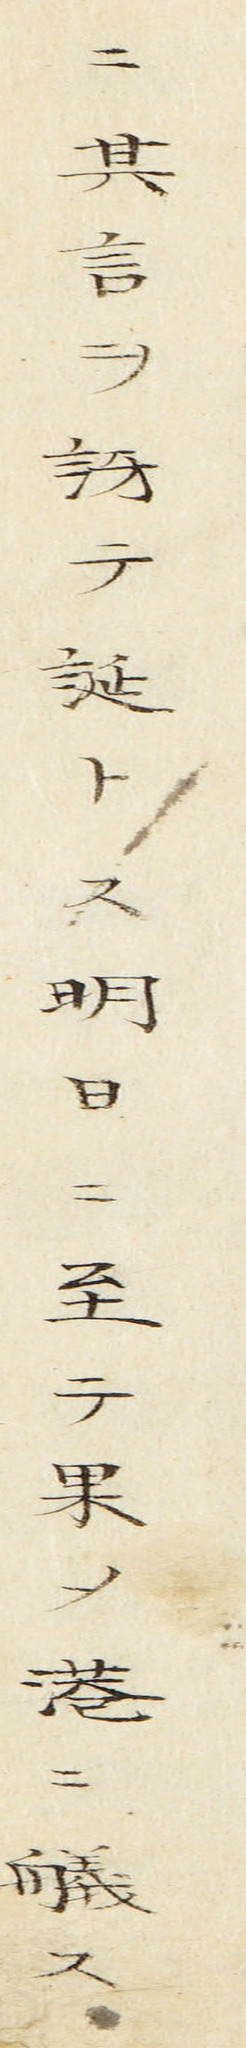ニ其言ヲ訝テ誕トス明日ニ至テ果シテ港ニ艤ス
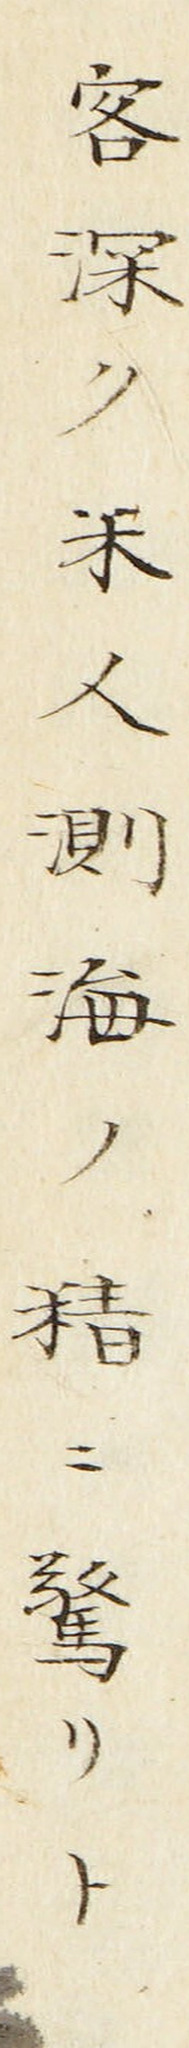客深ク米人測海ノ精ニ驚リト

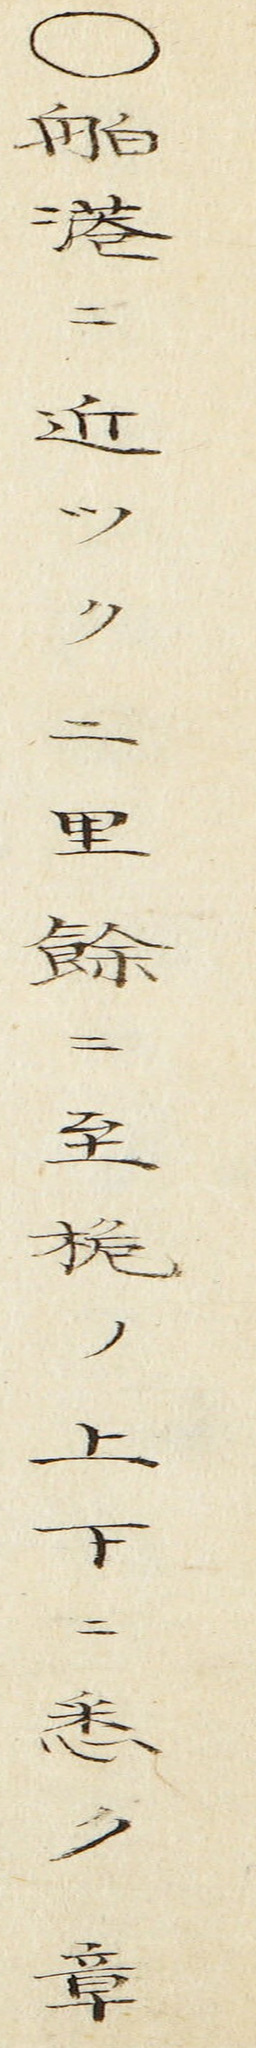○舶港ニ近ツク二里余ニ至桅ノ上下ニ悉ク章
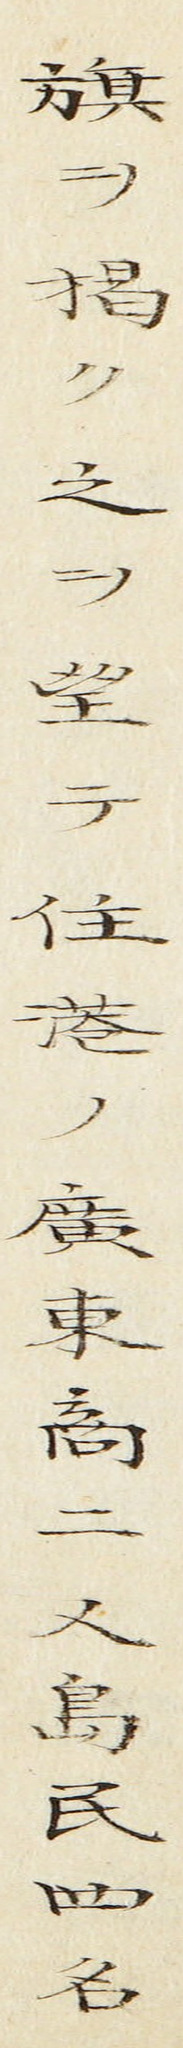旗ヲ掲ク之ヲ望テ住港ノ広東商二人島民四名
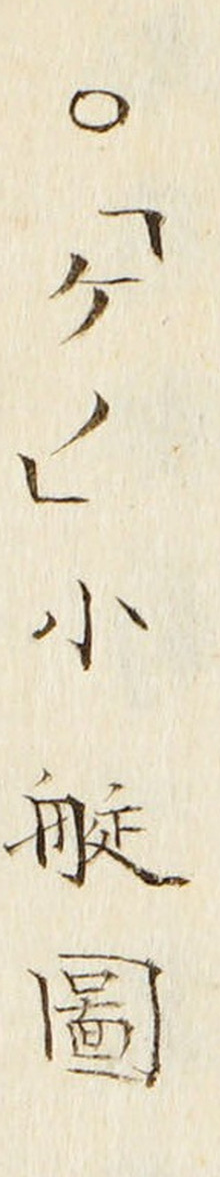◦「ケノ」小艇図
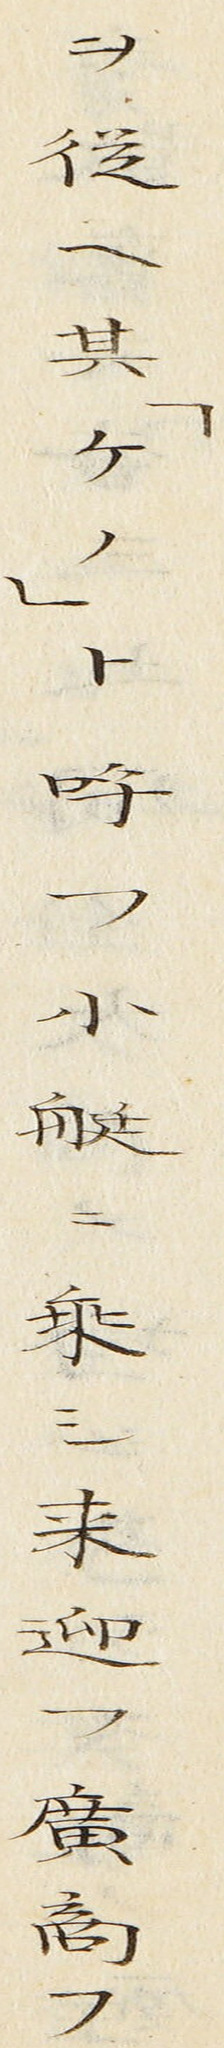ヲ従ヘ其「ケノ」ト呼フ小艇ニ乗シ来迎フ広商フ
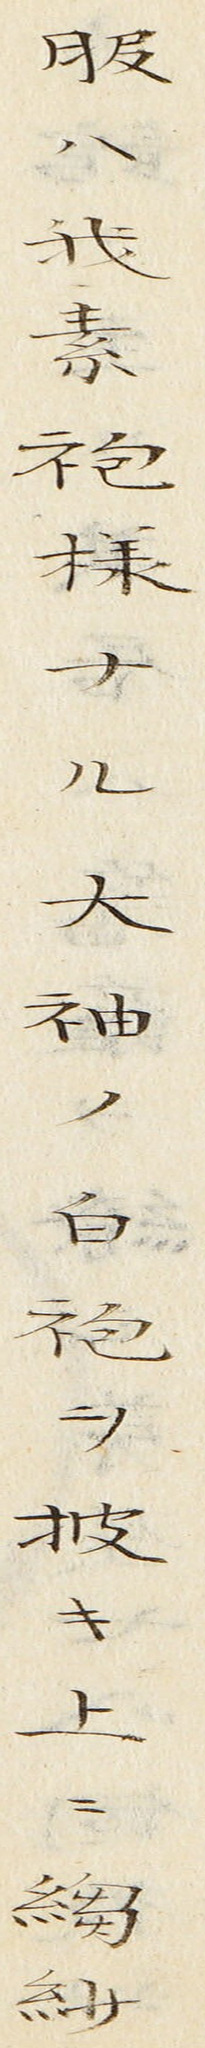服ハ我素袍様ナル大袖ノ白袍ヲ披キ上ニ縐紗
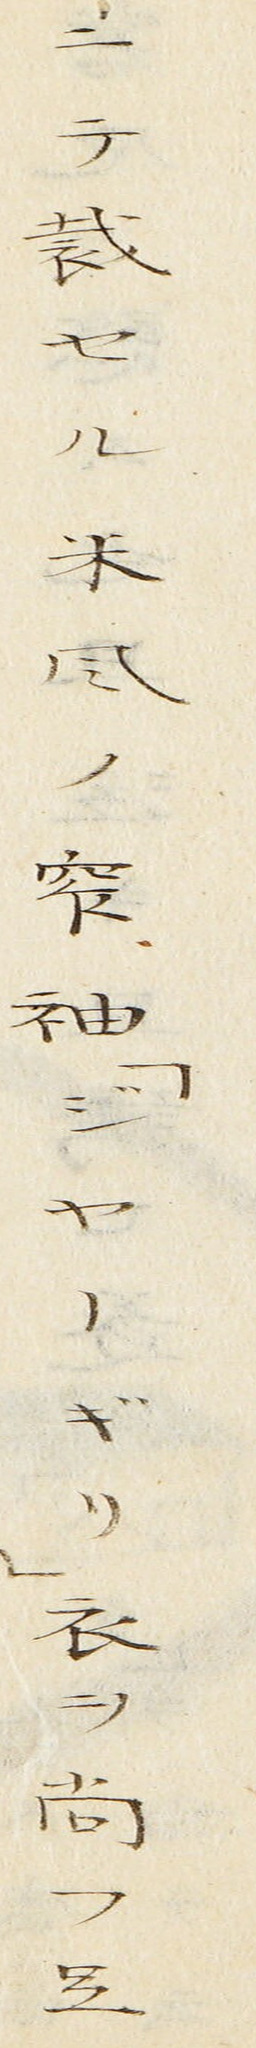ニテ裁セル米風ノ窄袖「ジヤーギリ」衣ヲ尚フ足
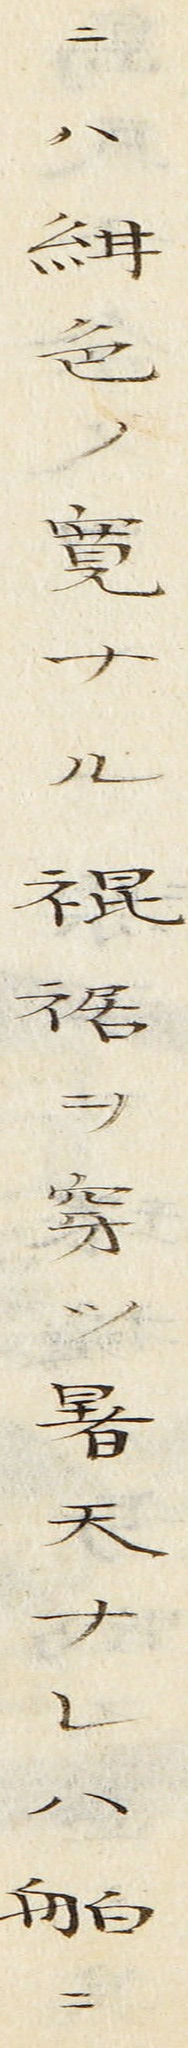ニハ紺色ノ寛ナル裩裾ヲ穿ツ暑天ナレハ舶ニ
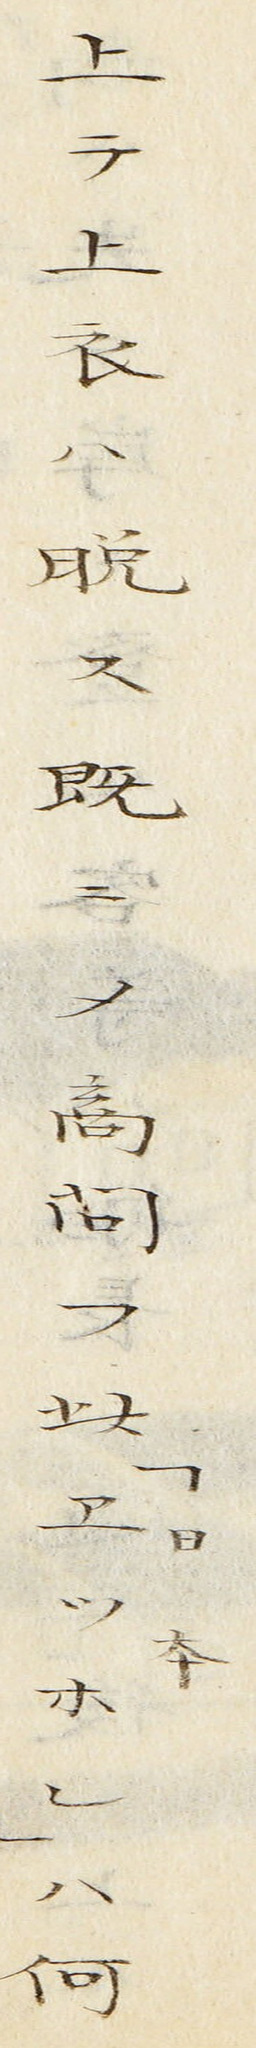上テ上衣ハ脱ス既ニシテ商問フ之此「ヱツホン」ハ何
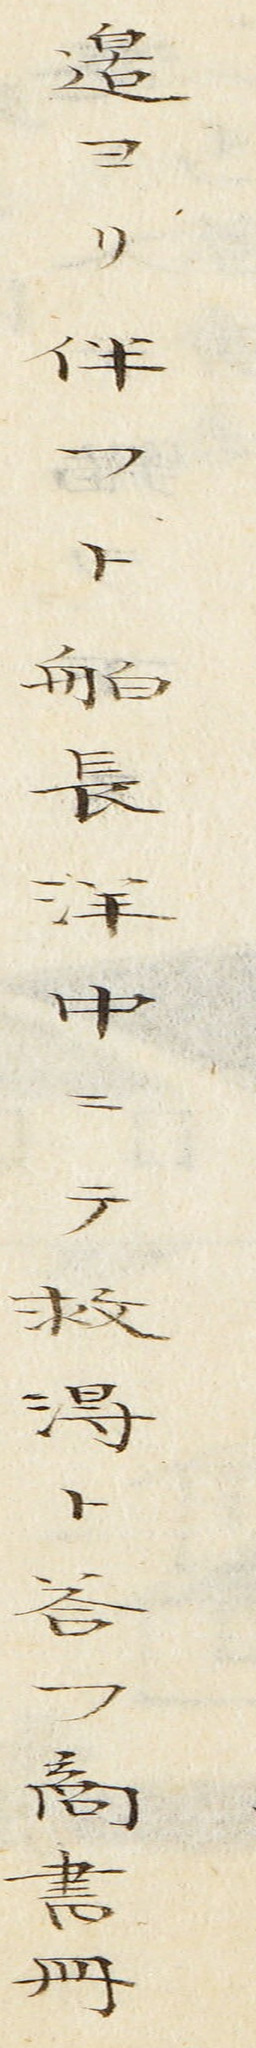辺ヨリ伴フト舶長洋中ニテ救得ト答フ商書冊
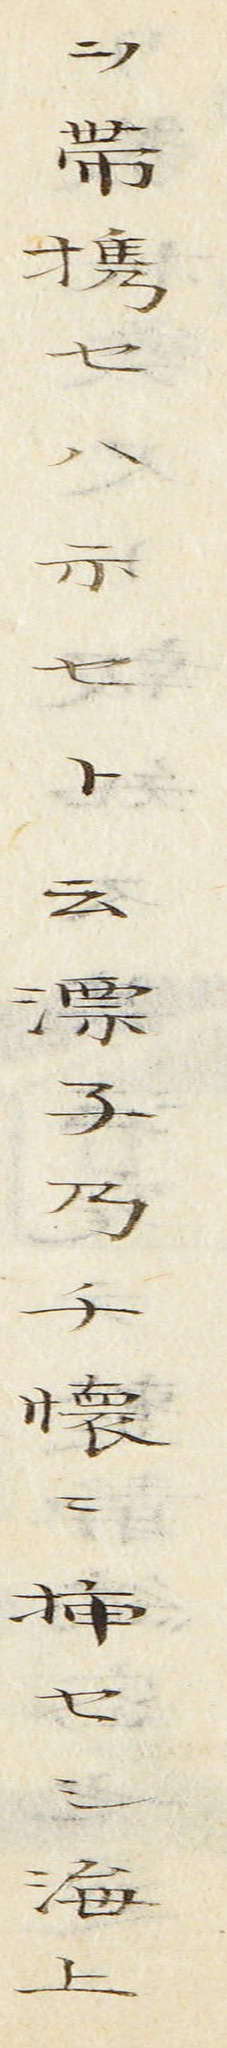ヲ帯携セハ示セト云漂子乃チ懐ニ挿セシ海上
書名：蕃談
